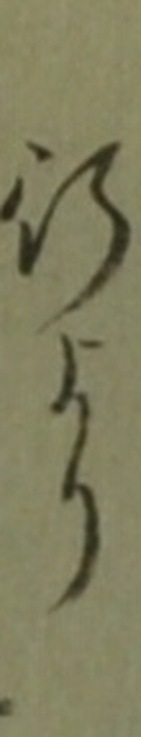行より
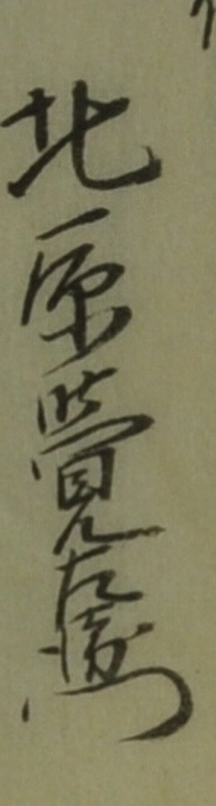北原覚左衛門
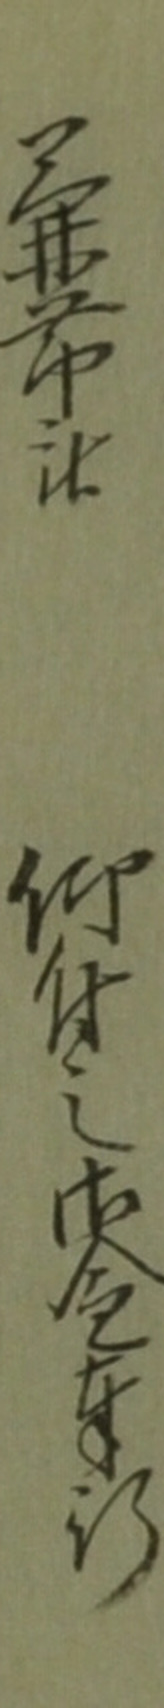兼帯被仰付之御金奉行
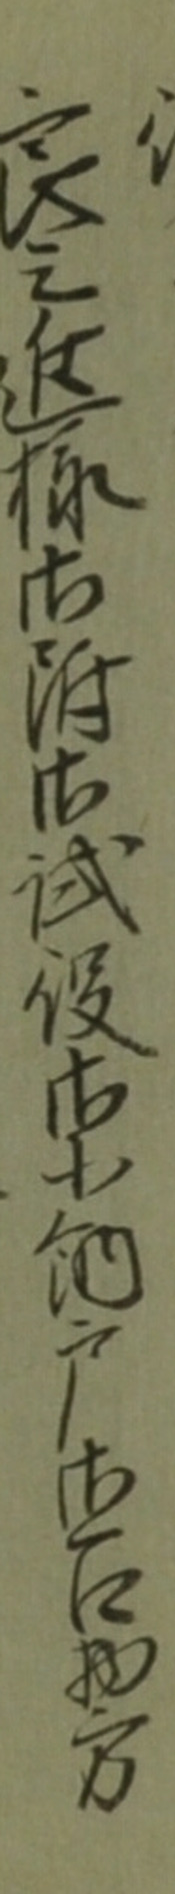良之進様御附御試役御小納戸御召物方
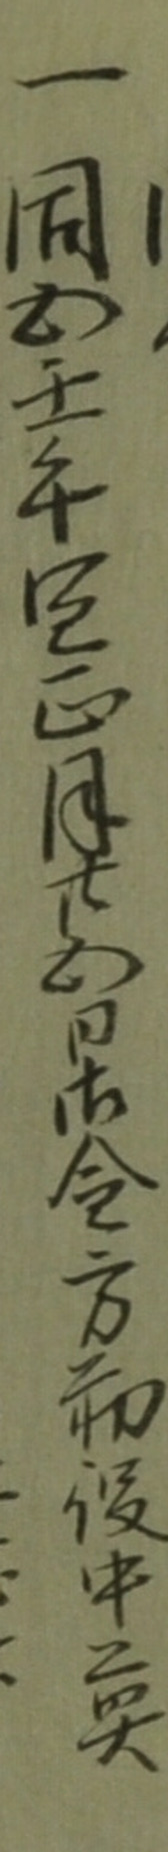一同五壬午閏正月廿五日御金方勤役中莫
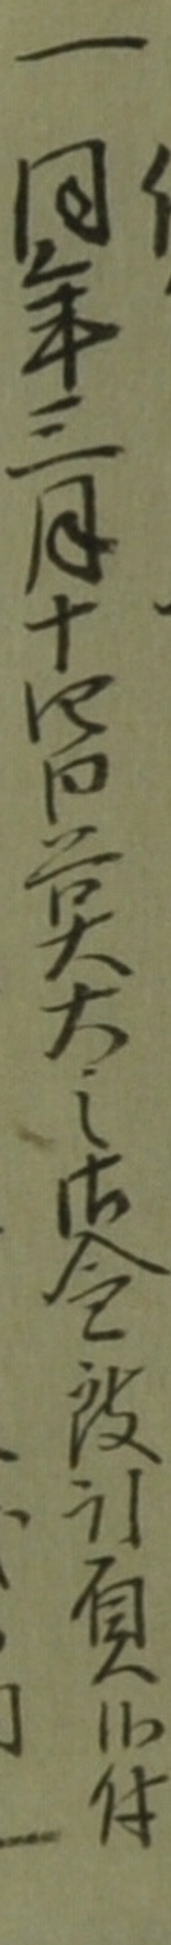一同年三月十四日莫大之御金致引負候付
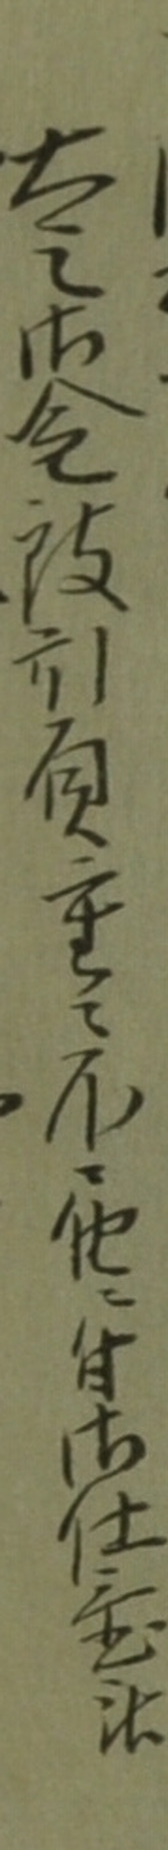大之御金致引負重々不届ニ付御仕置被
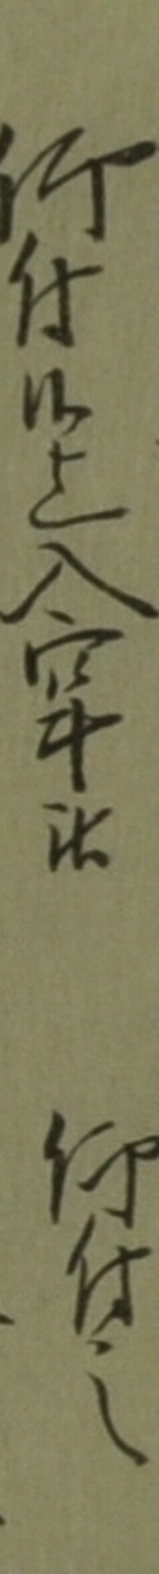仰付候上入牢被仰付之
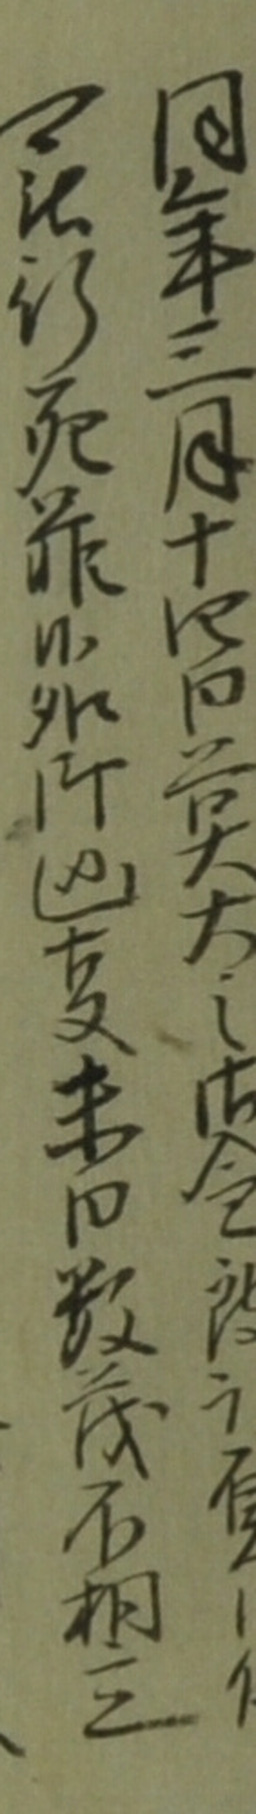可被行死罪候処御凶事未日数茂不相三
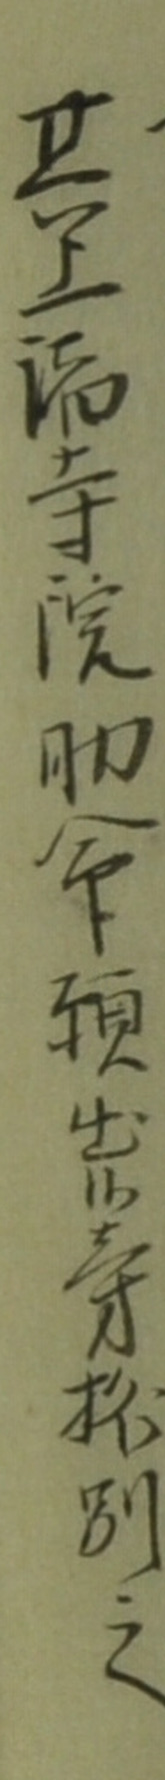其上諸寺院助命願出候旁格別之

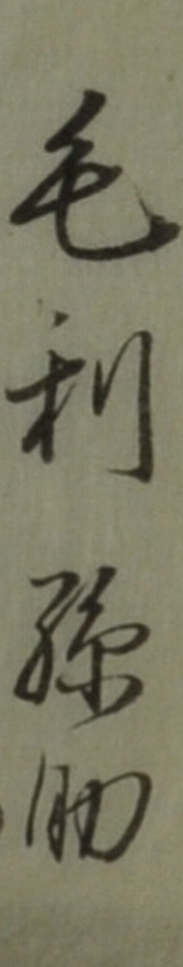毛利孫助
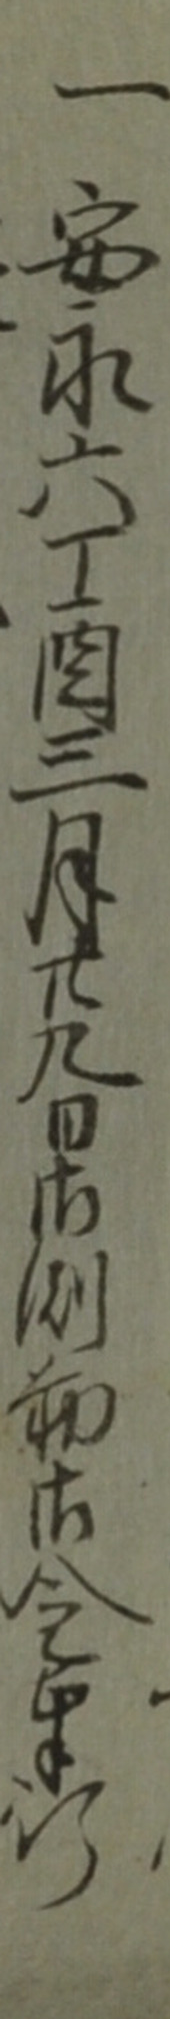一安永六丁酉三月廿九日御側勤御金奉行
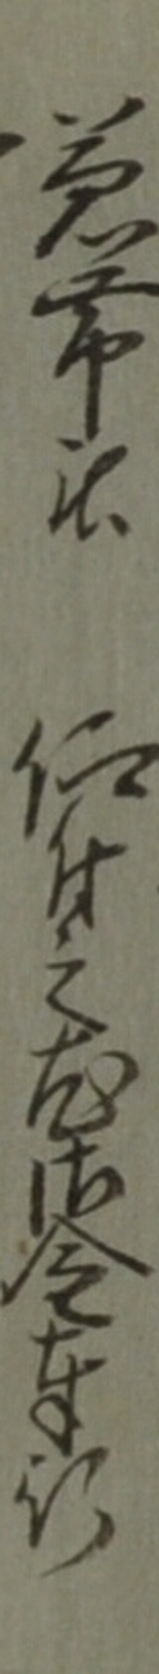兼帯被仰付之尤御金奉行
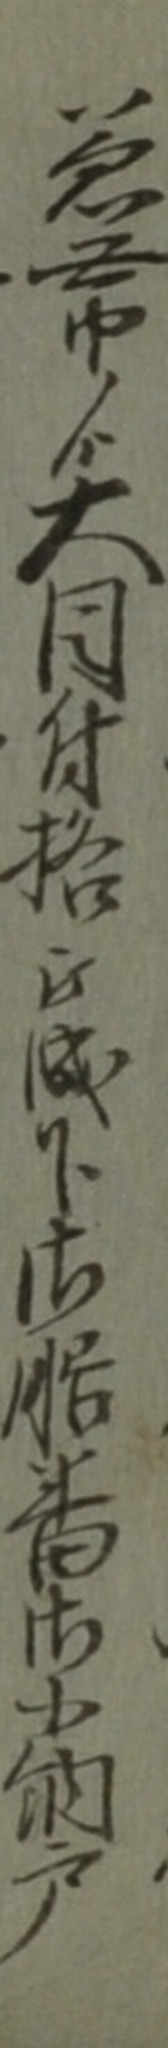兼帯ゟ大目付格被成下御膳番御小納戸
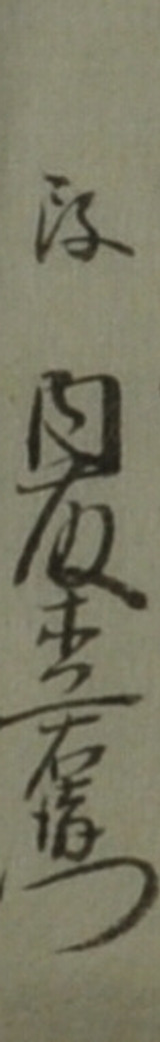後内藤杢右衛門
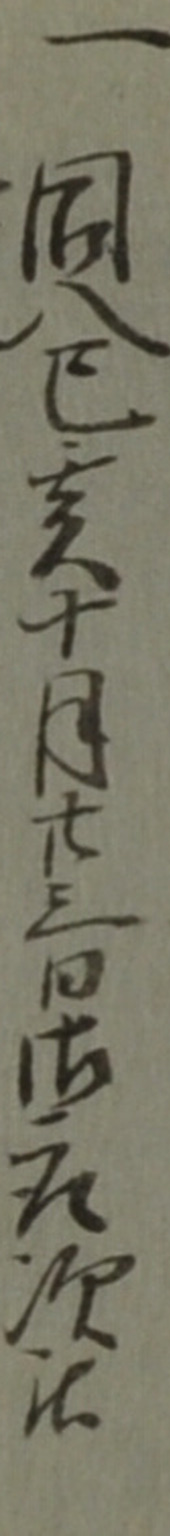一同八己亥十月廿三日御取次
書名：諸御役代々録（四）
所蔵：伊那市立高遠町図書館・合同会社AMANE
